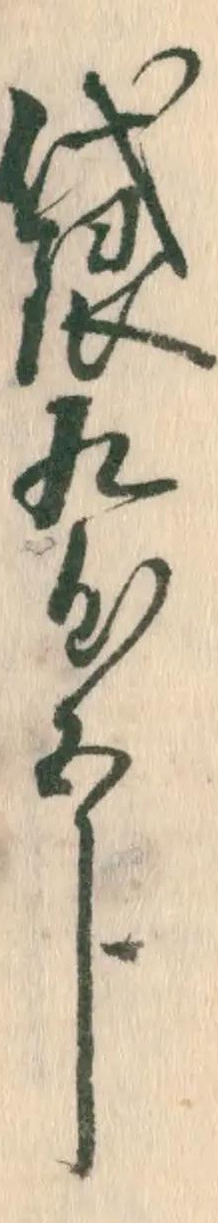代銀九匁五分
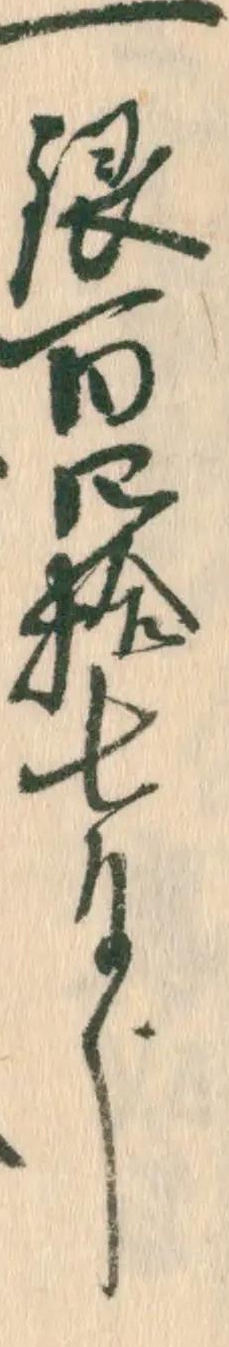〆銀百四拾七匁
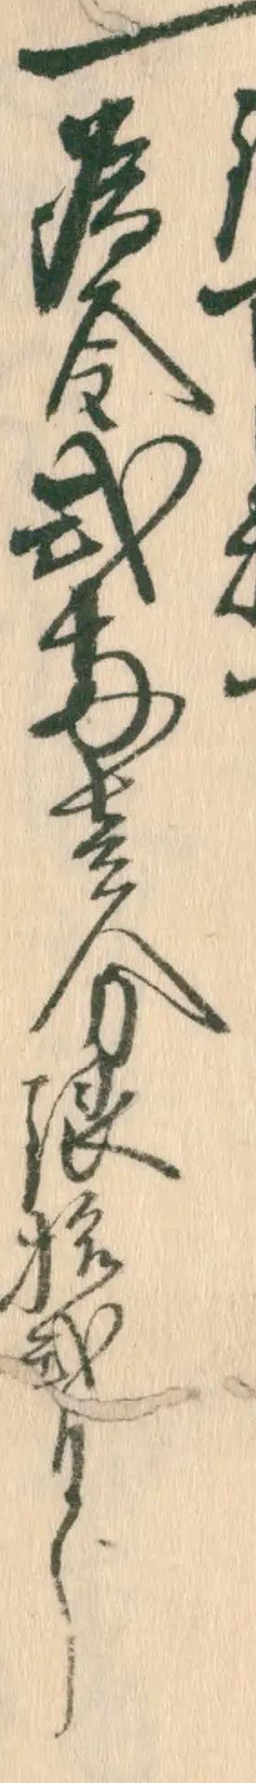為金弐両壱分銀拾弐匁
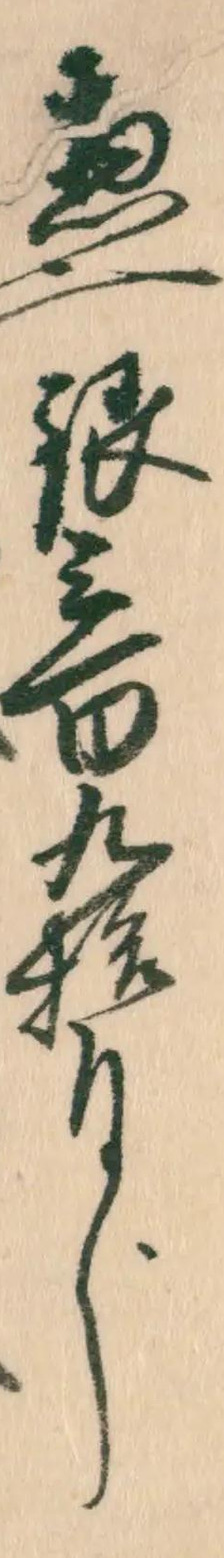惣〆銀三百九拾匁
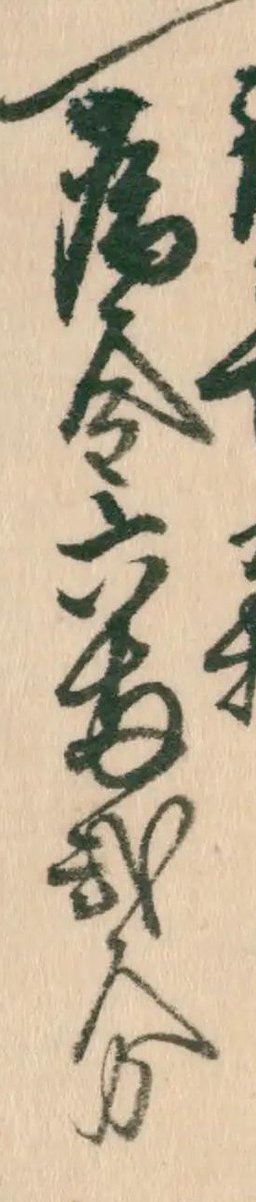為金六両弐分
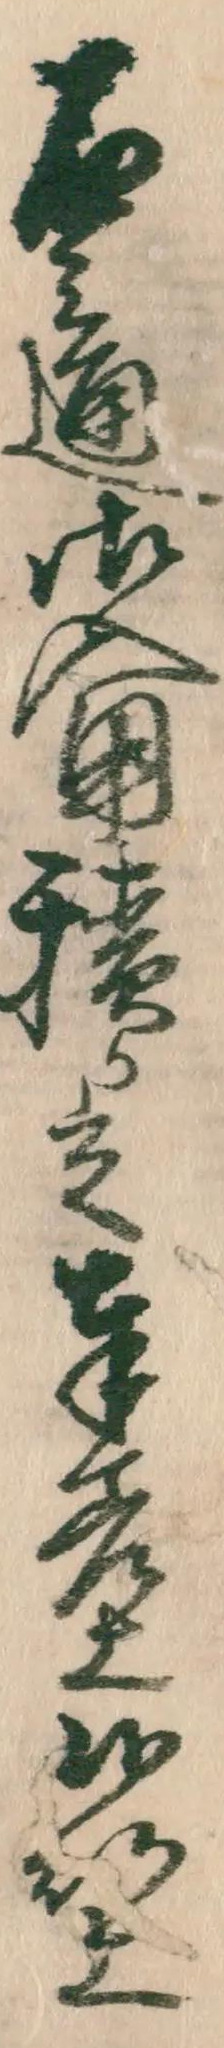右之通御入用積り立奉差上候以上
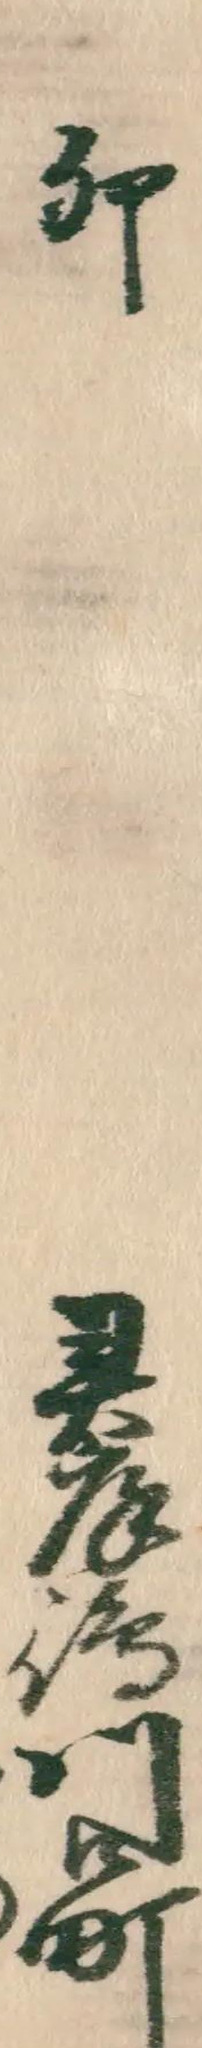卯霊岸島川口町
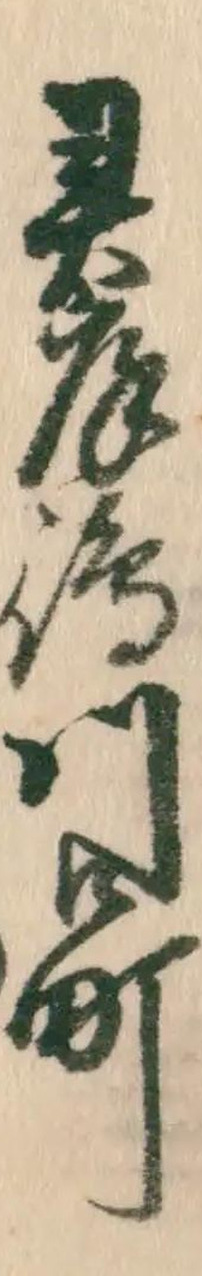卯霊岸島川口町
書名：三橋 17巻. [8] 三橋小破御修復書留　但御奉行御掛リ替地震潰橋番屋　嘉永四亥年より安政二卯年迄　下
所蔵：国立国会図書館 National Diet Library, JAPAN
